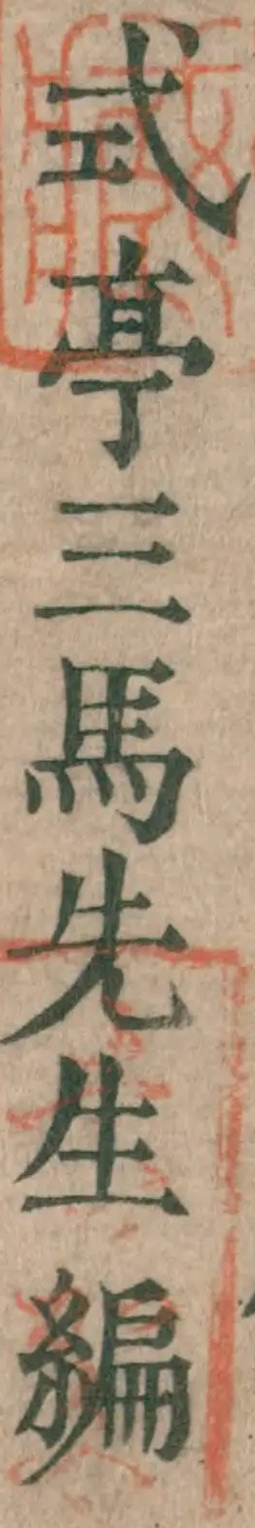式亭三馬先生編
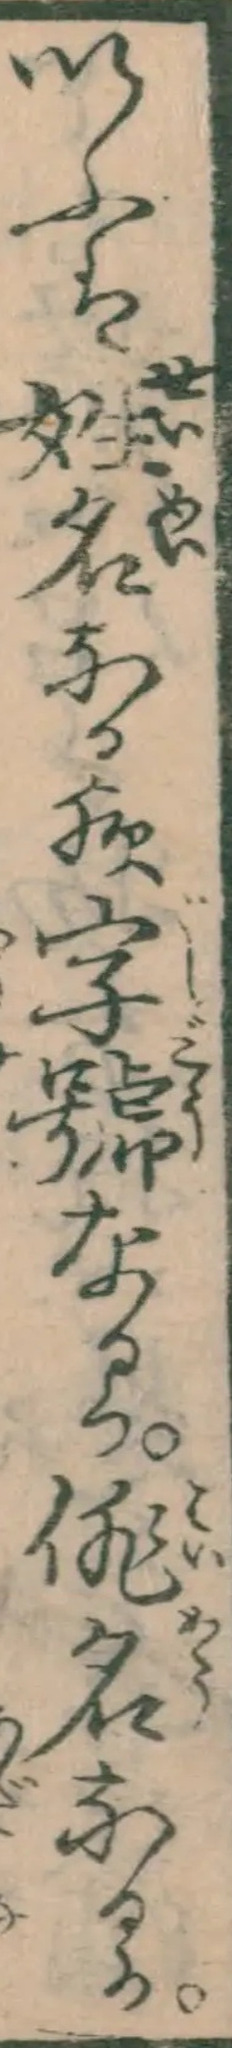いふは姓名なる歟字号なるか。俳名なるか。
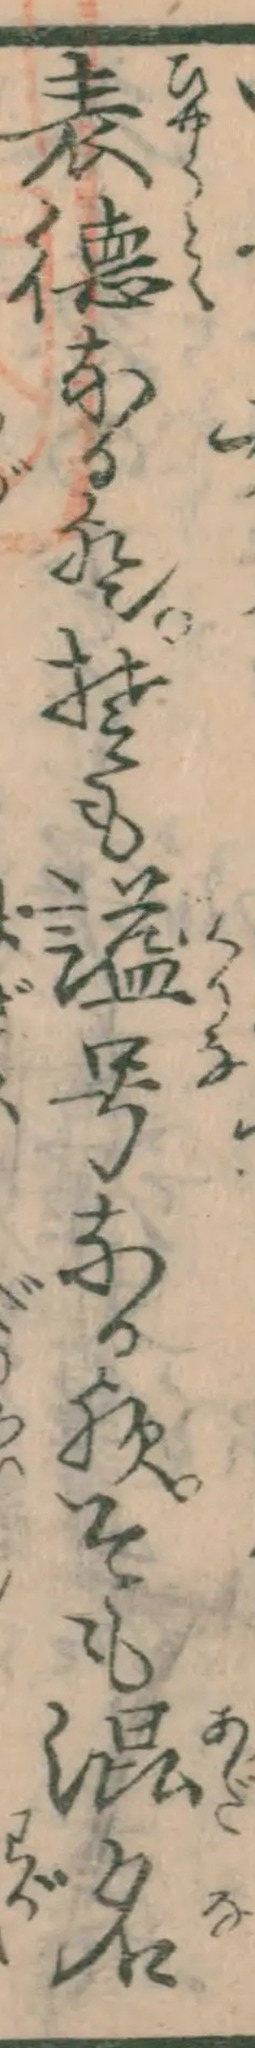表徳なる歟。そも諡号なる歟。そも混名
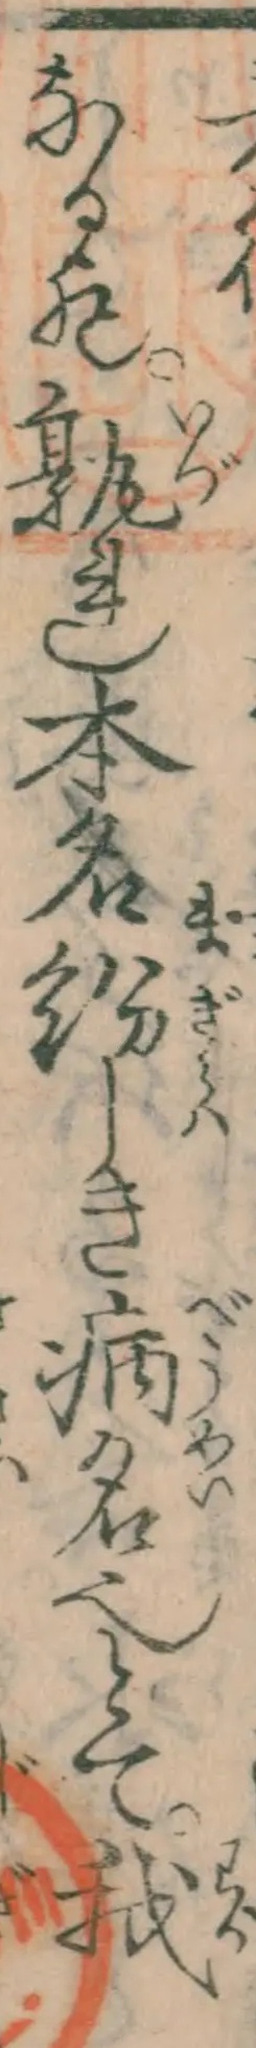なる歟。孰れ本名紛しき病名也とて。我
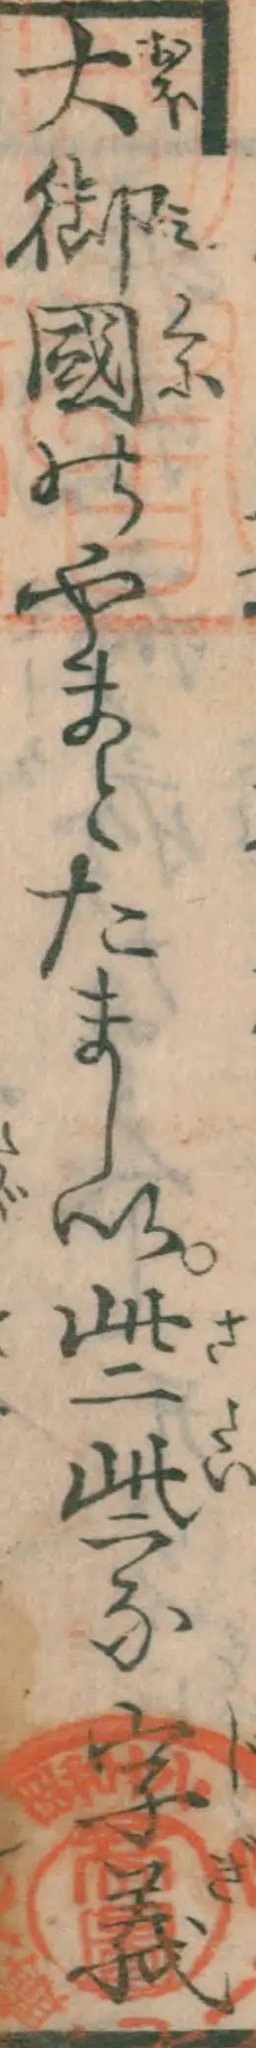大御国のやまとたましい。些些な字義
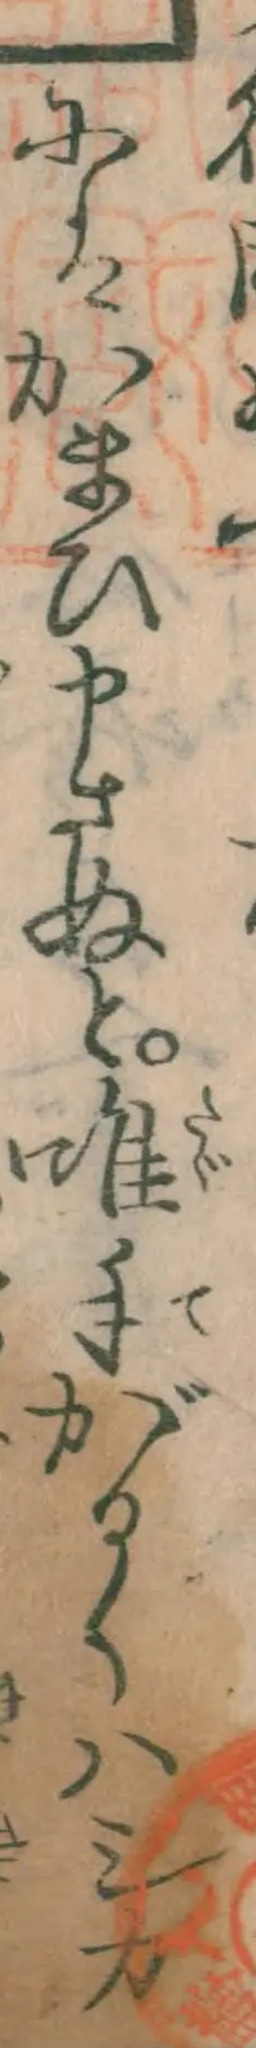にはかまひ申さぬと。唯手がるくハシカ
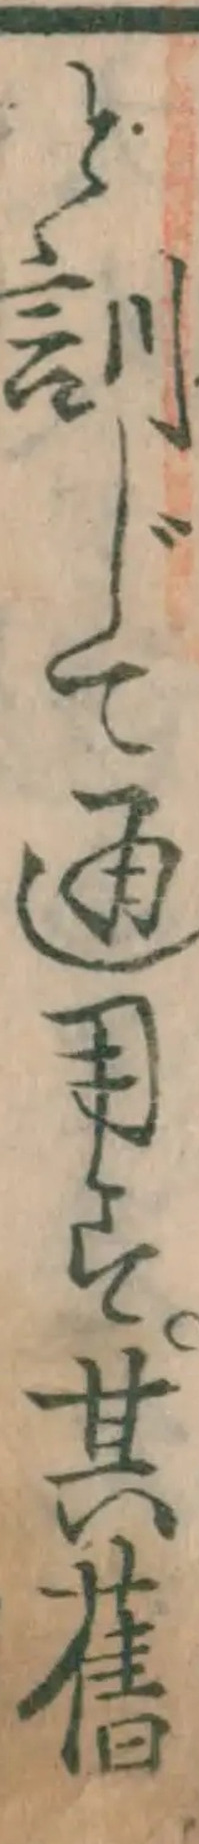と訓じて通用す。其旧
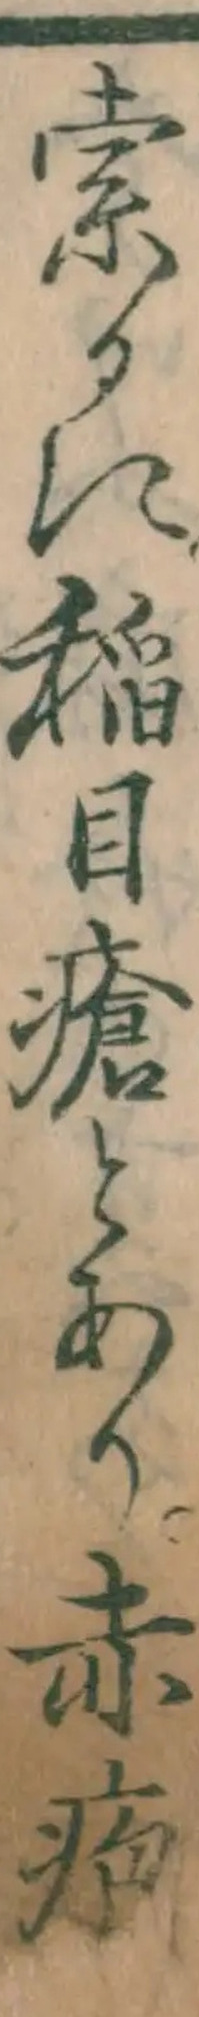索るに。稲目瘡とあり。赤疱

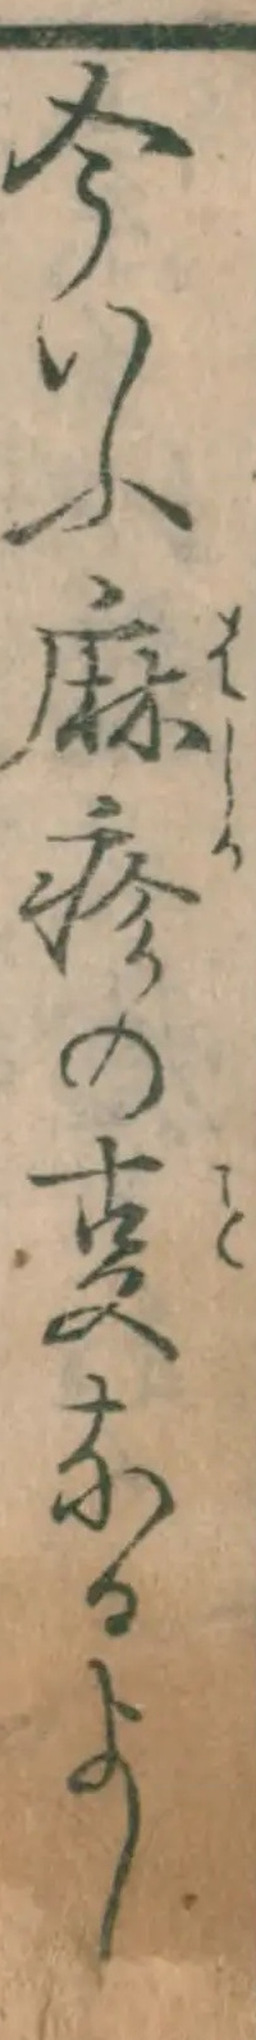今いふ麻疹の事なるよし
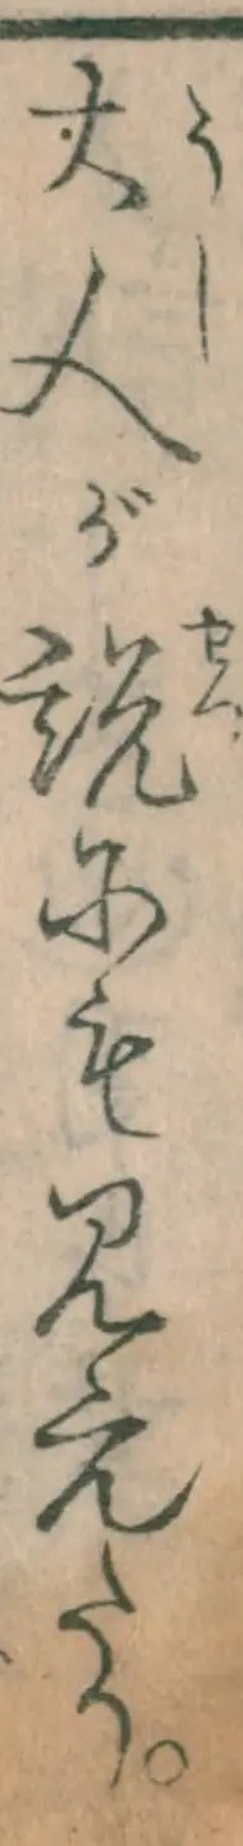大人が説にも見えたり。
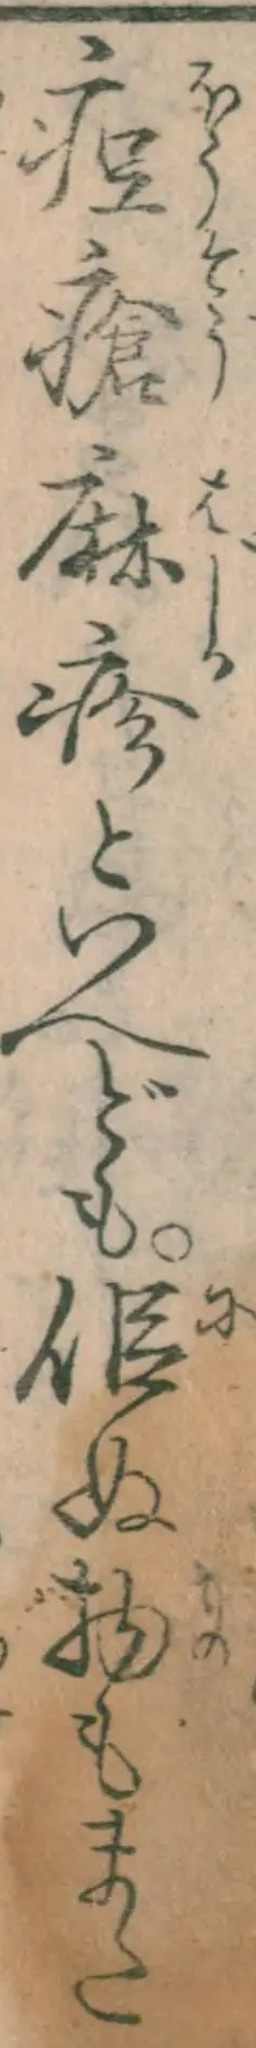疱瘡麻疹といへども。似ぬ物もまた
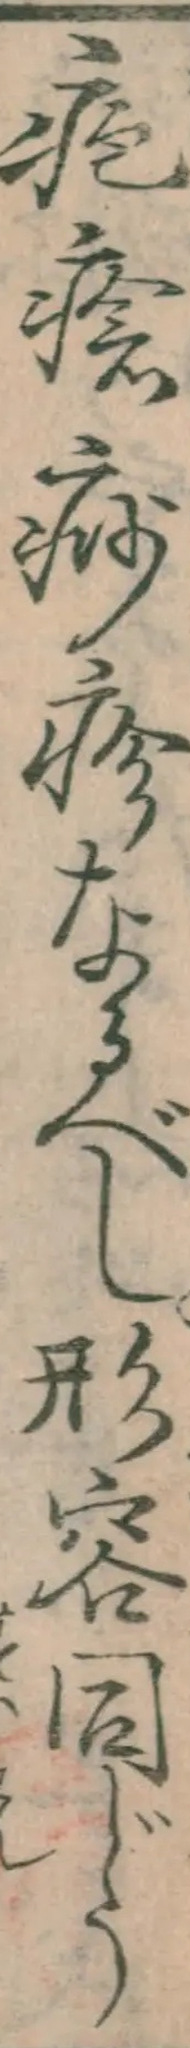疱瘡麻疹なるべし。形容同じう
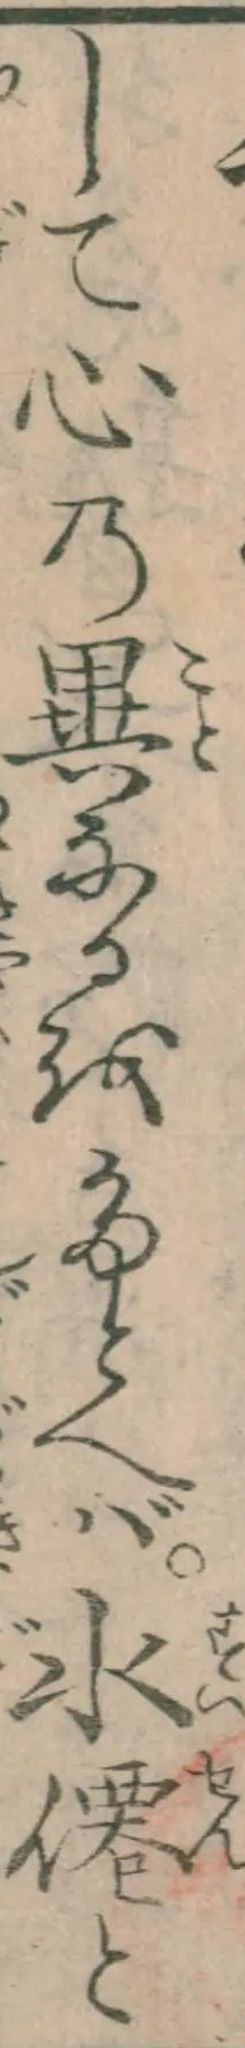して心の異なるをたとへば。水僊と
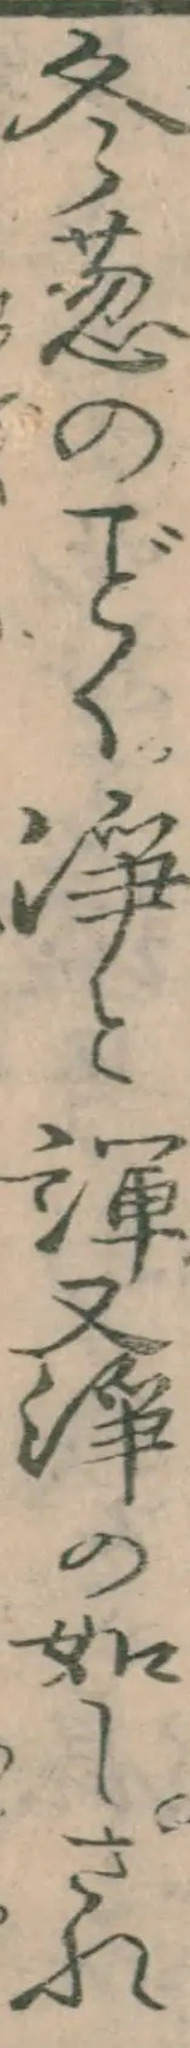冬葱のごとく浄と諢又浄の如し。され
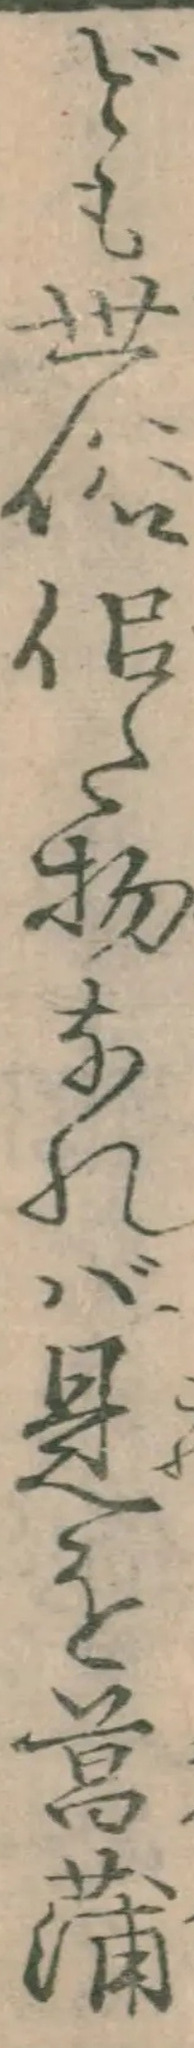ども世俗似た物なれば是を菖蒲
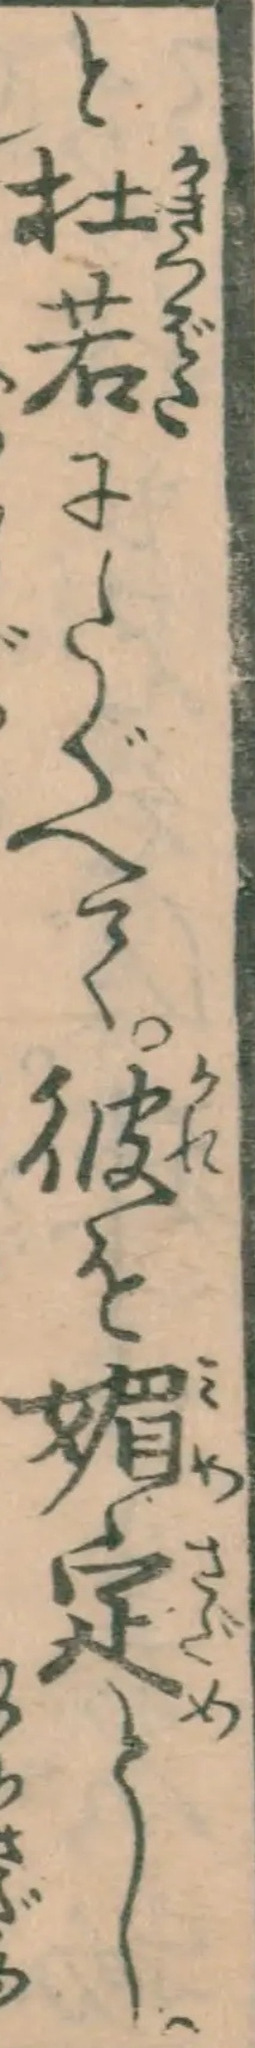と杜若にたぐへて。彼を媚定とし。
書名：麻疹戯言
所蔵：国立国会図書館 National Diet Library, JAPAN
